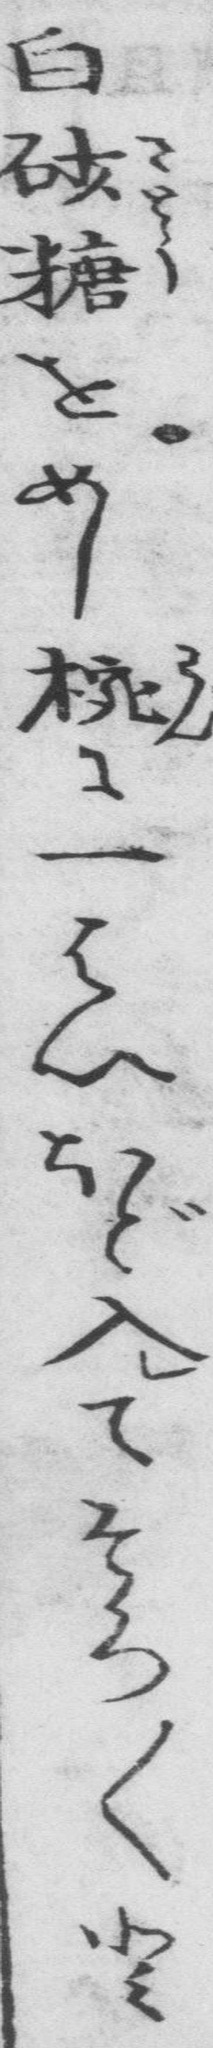白砂糖を。めし椀に一盃ほど入れてそろ〳〵と
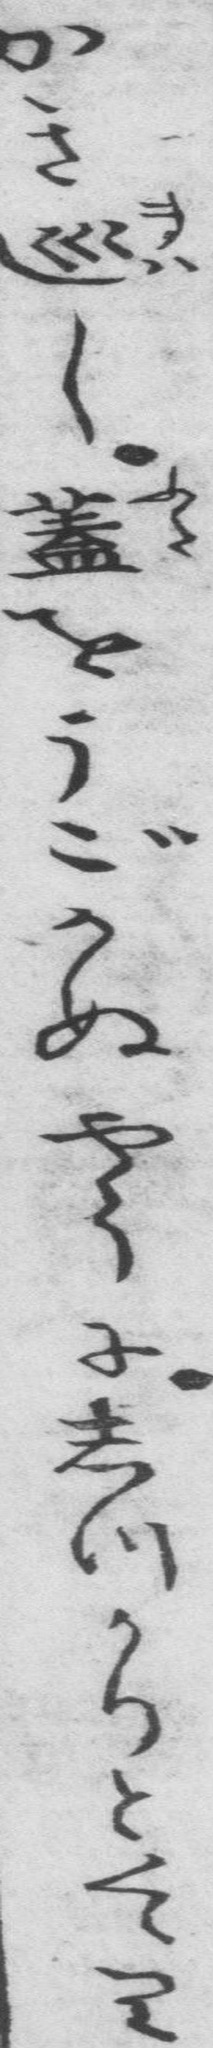かき巡し。蓋をうごかぬやうに。しつかりとくゝり

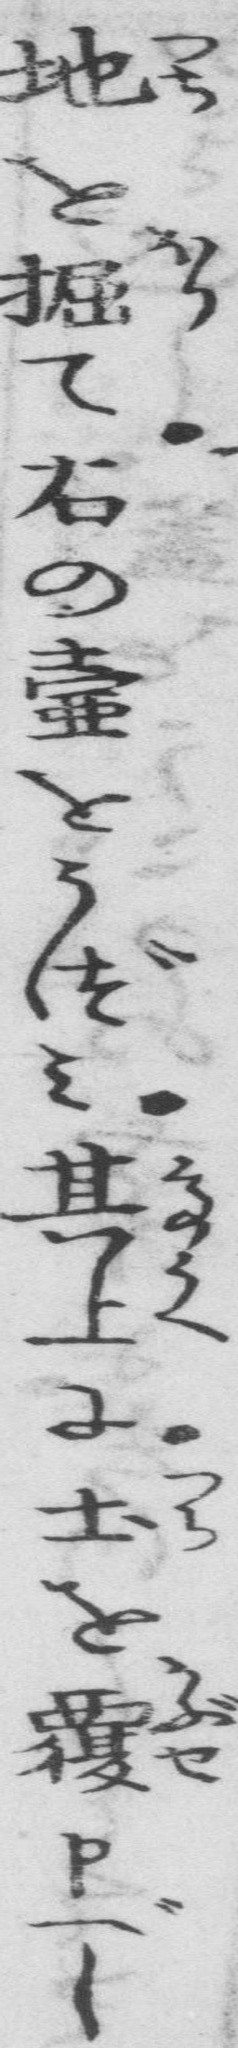地を掘て。右の壺をうづみ。其上に。土を覆申べし
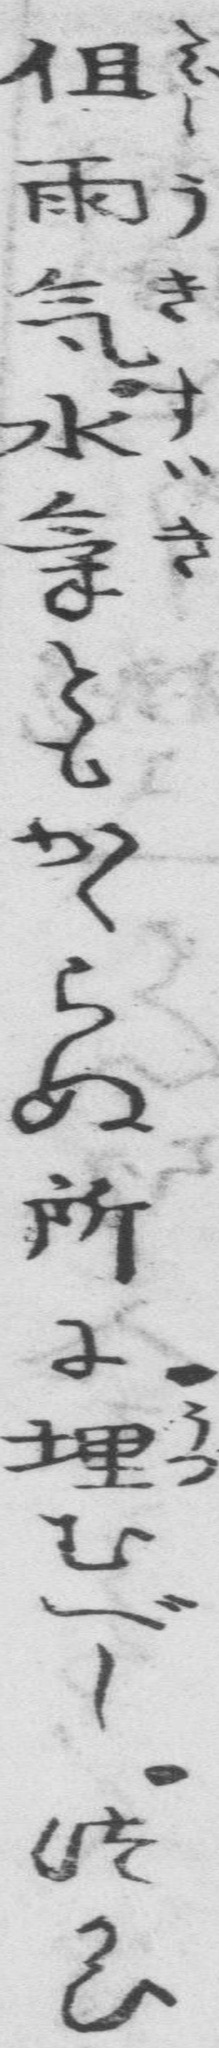但雨気。水気ともかゝらぬ所に。埋むべし。つかひ
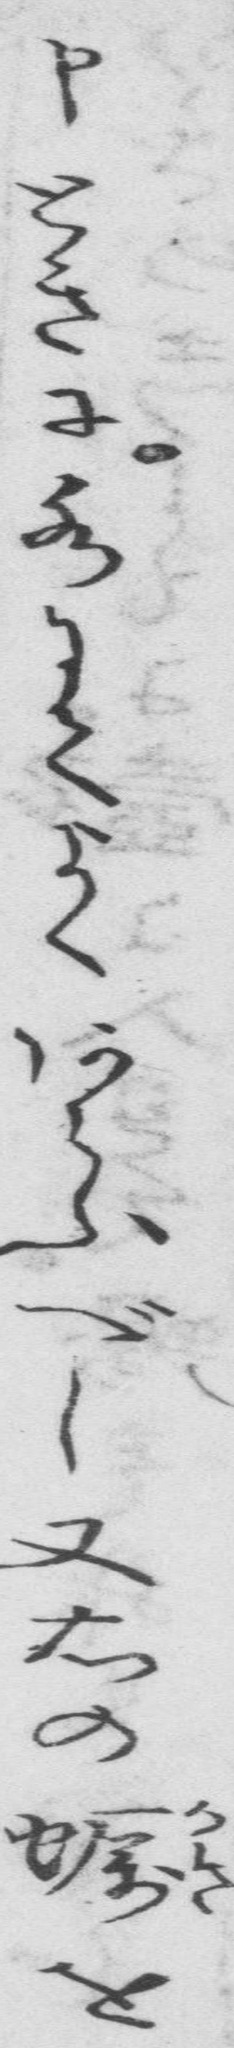申ときに。水にてよくあらふべし又右の蠣を
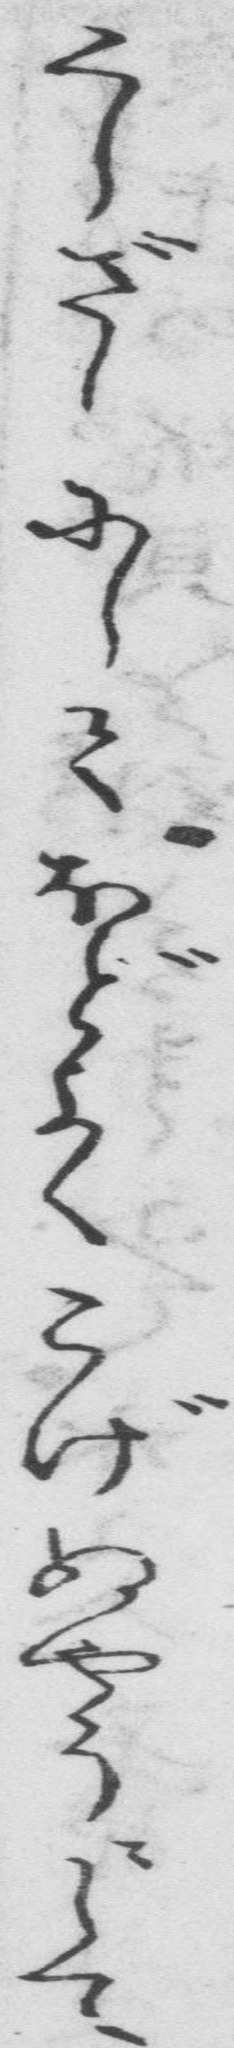くしざしにして。ほどよくこげぬやうにして
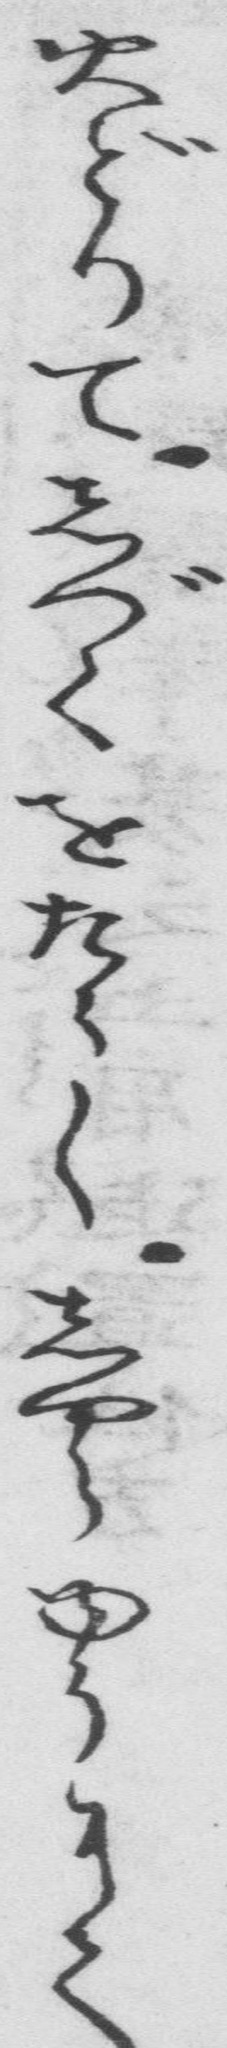火どりて。しづくをたらし。しやうゆうにて
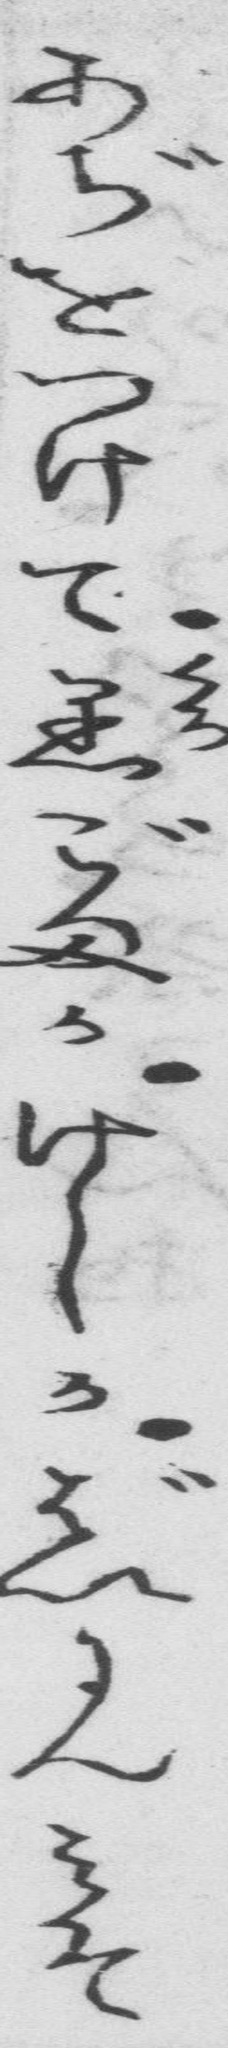あぢをつけて。黒ごまか。けしか。ばいにんみそ
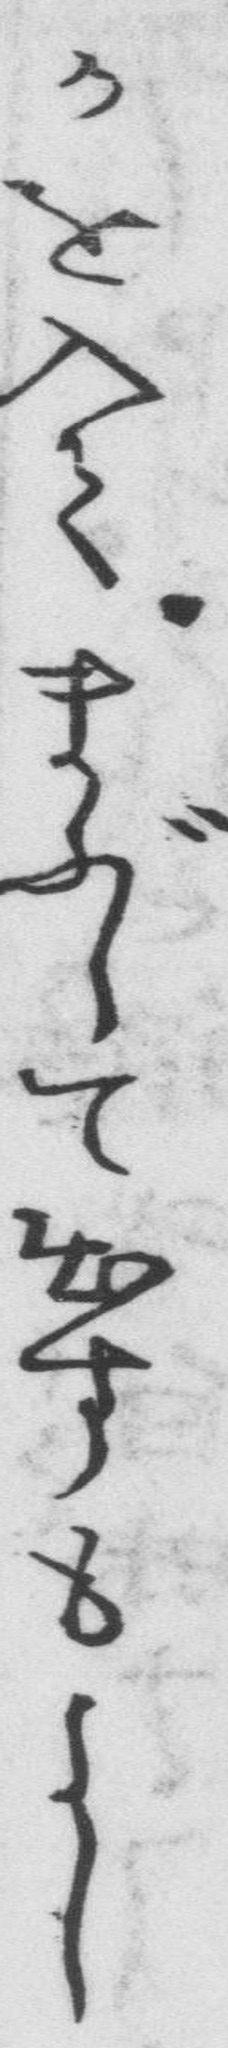かを入て。まぶして出すもよし
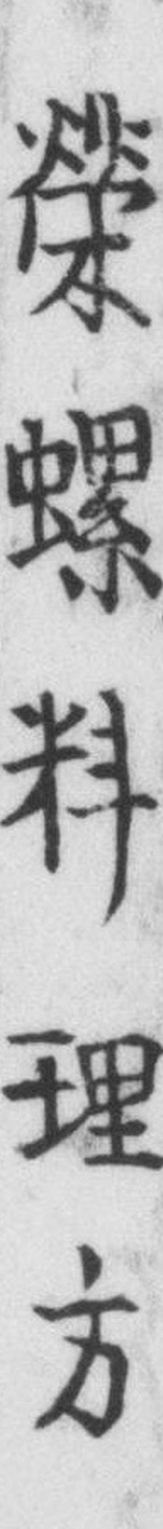栄螺料理方
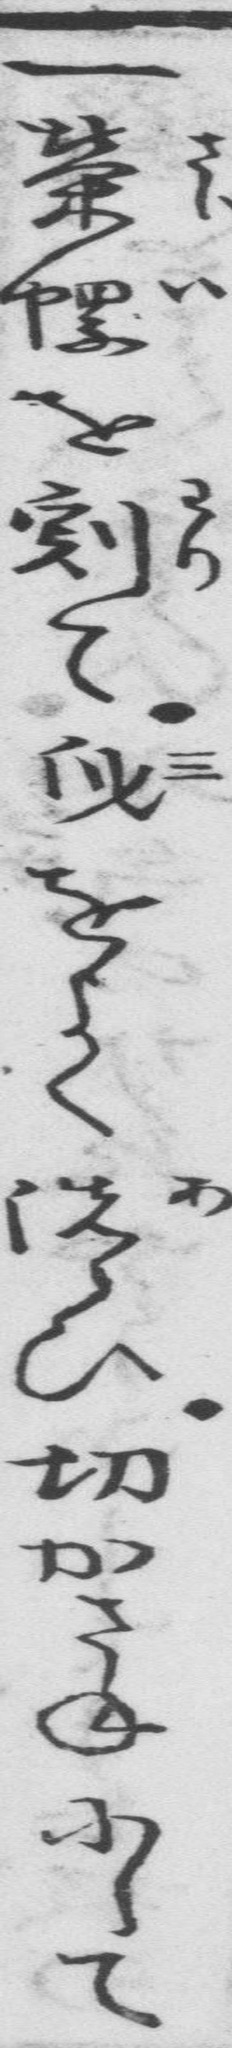一栄螺を割て。身をよく洗らひ。切かさねにして
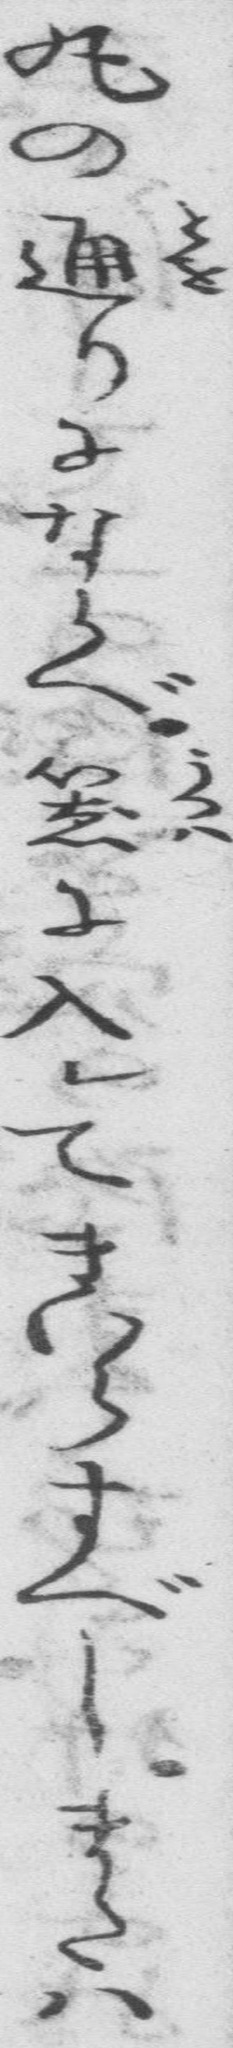丸の通りにならべ。器に入れてまいらすべし。または
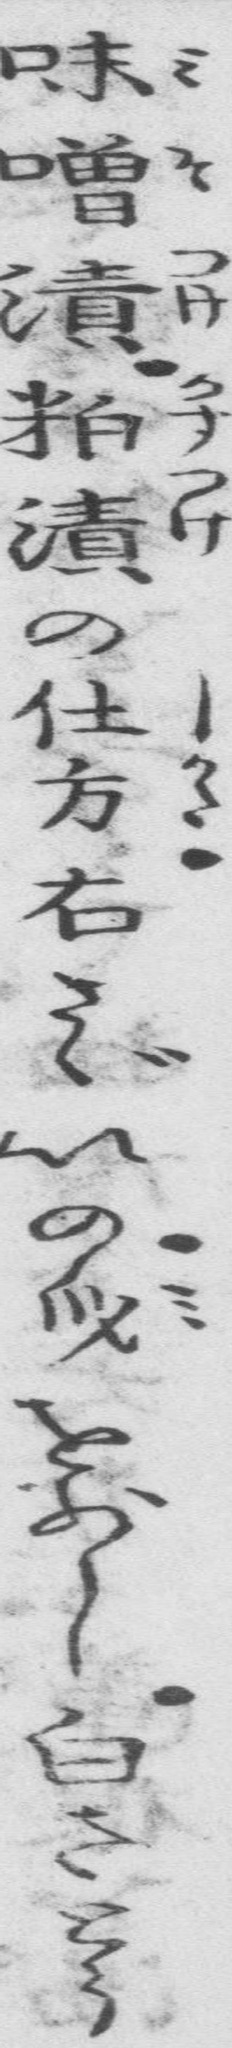味噌漬。粕漬の仕方。右さゞいの身を少し。白さとう
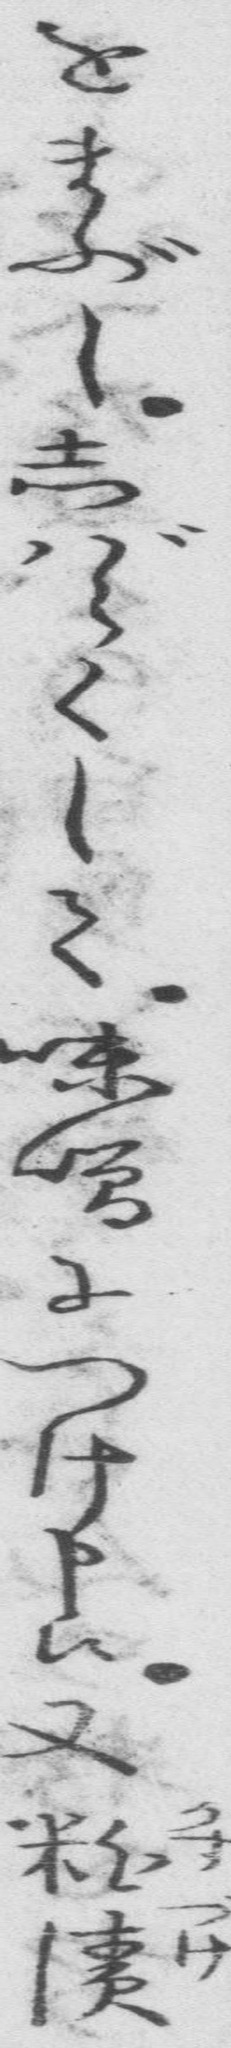をまぶし。しばらくして。味噌につけ申候。又粕漬
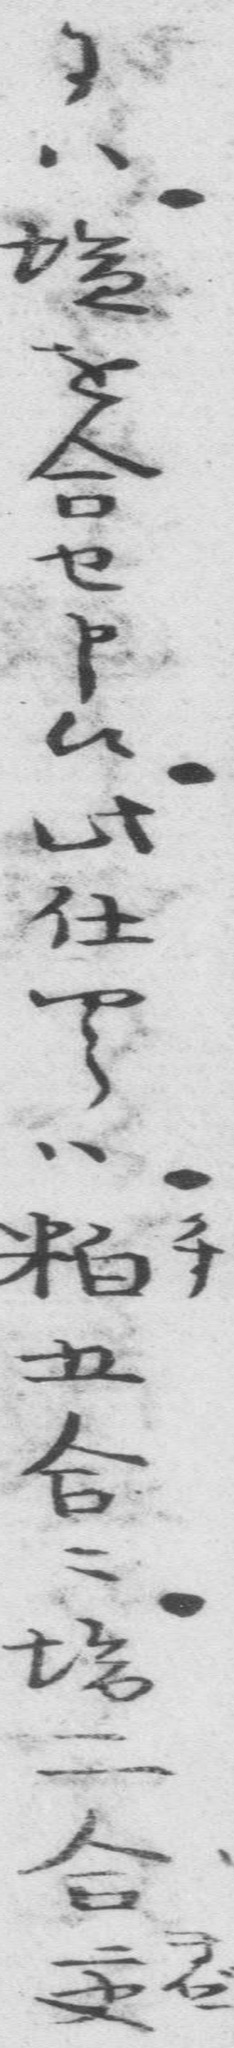には。塩を合せ申候。此仕やうは。粕五合に。塩二合交
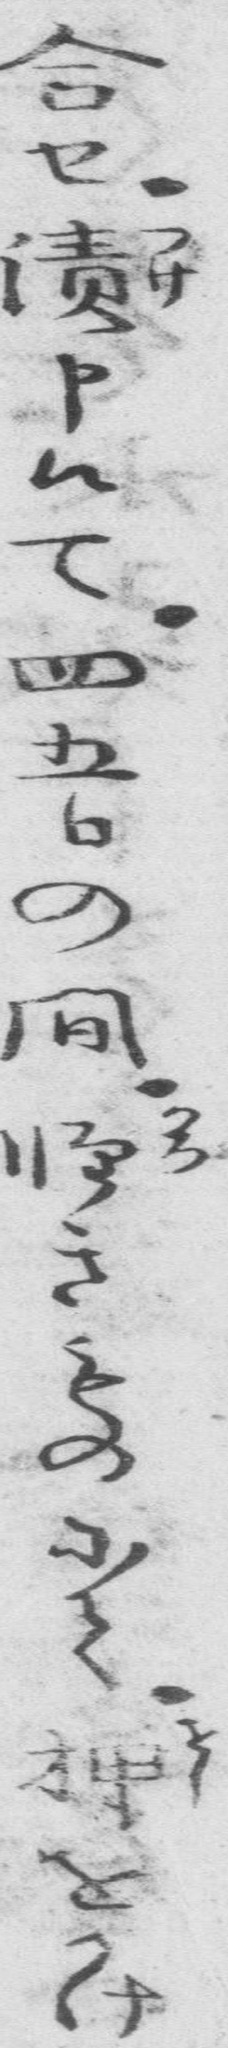合せ。漬申候て。四五日の間。軽きものにて。押をかけ
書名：萬寳料理秘密箱
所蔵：大阪府立大学学術情報センター 国文学研究資料館
